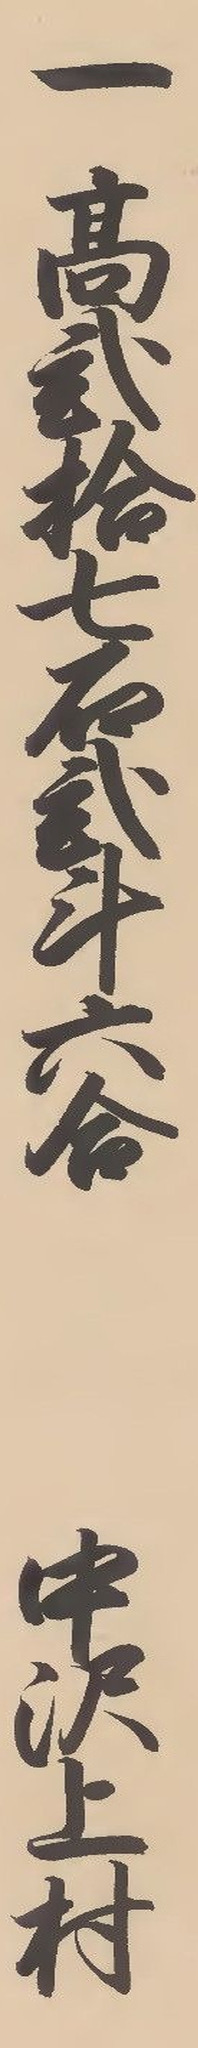一高弐拾七石弐斗六合中沢上村
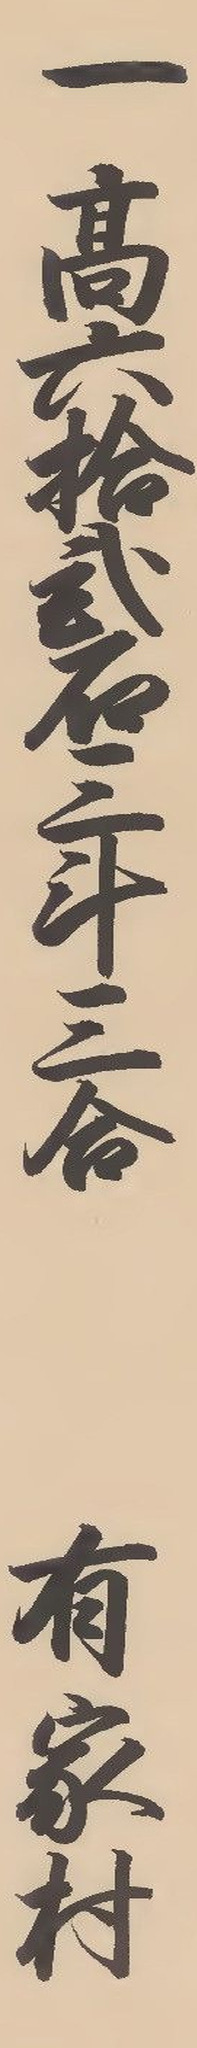一高六拾弐石三斗三合有家村
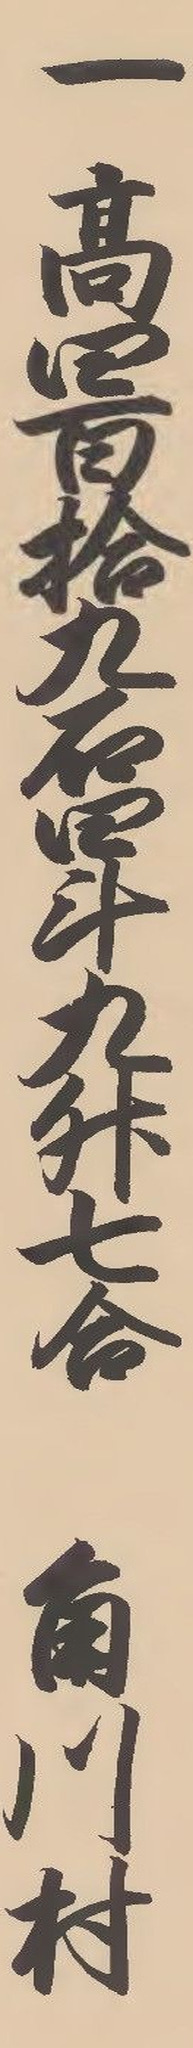一高四百拾九石四斗九升七合角川村
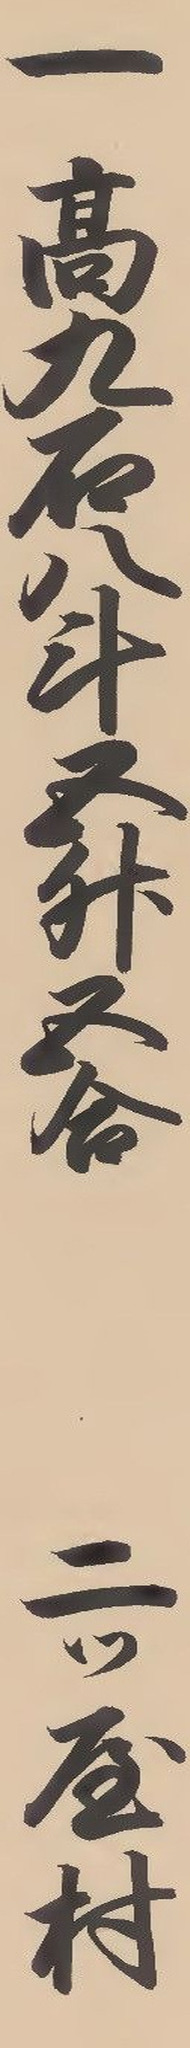一高九石八斗五升五合二ツ屋村
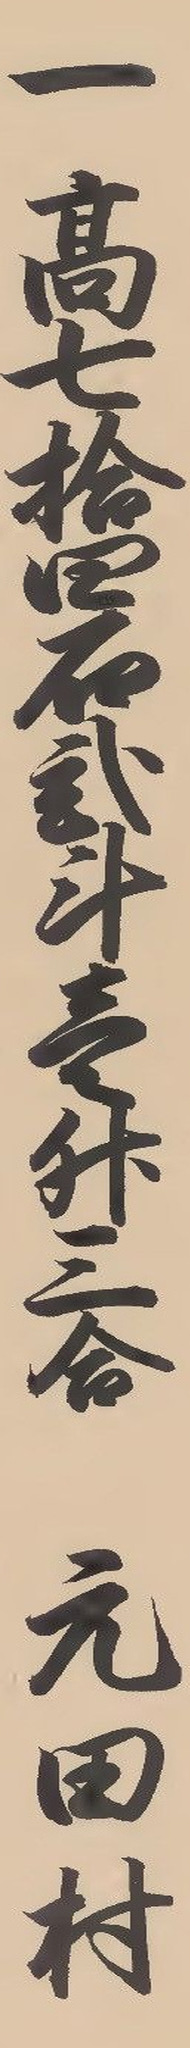一高七拾四石弐斗壱升三合元田村
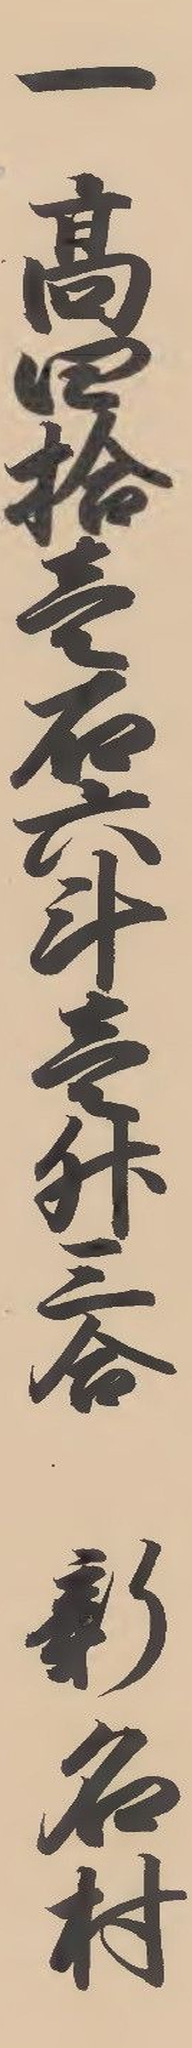一高四拾壱石六斗壱升三合新名村
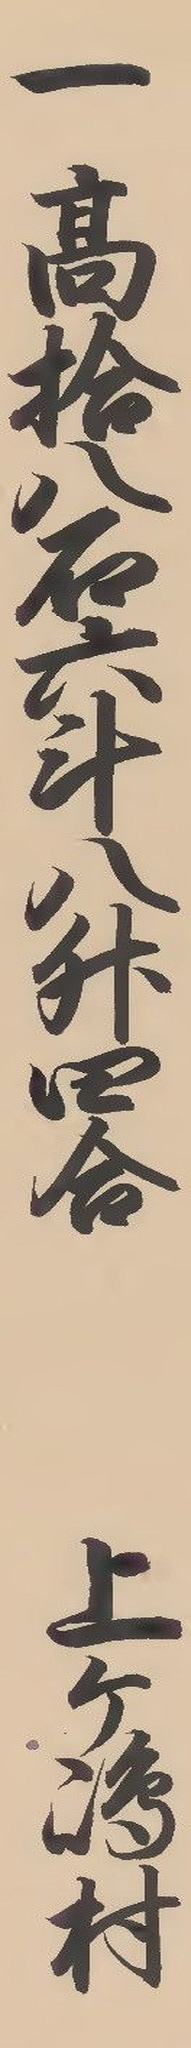一高拾八石六斗八升四合上ケ島村

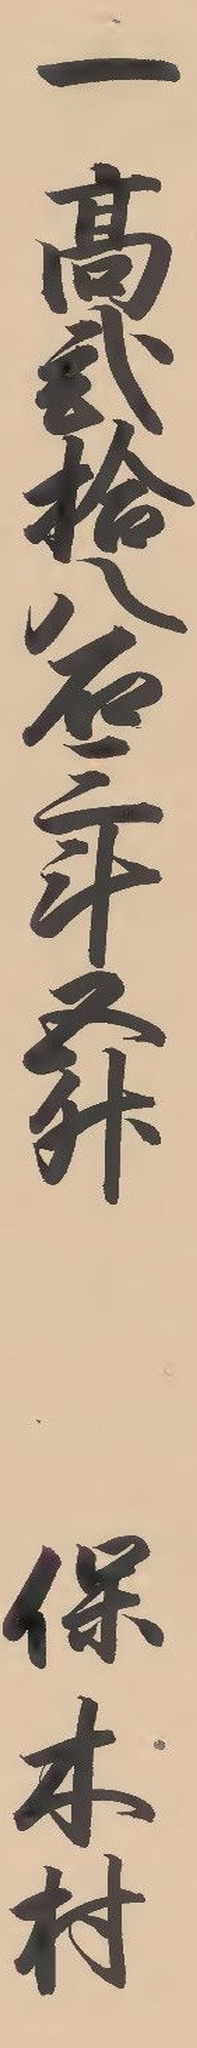一高弐拾八石三斗五升保木村
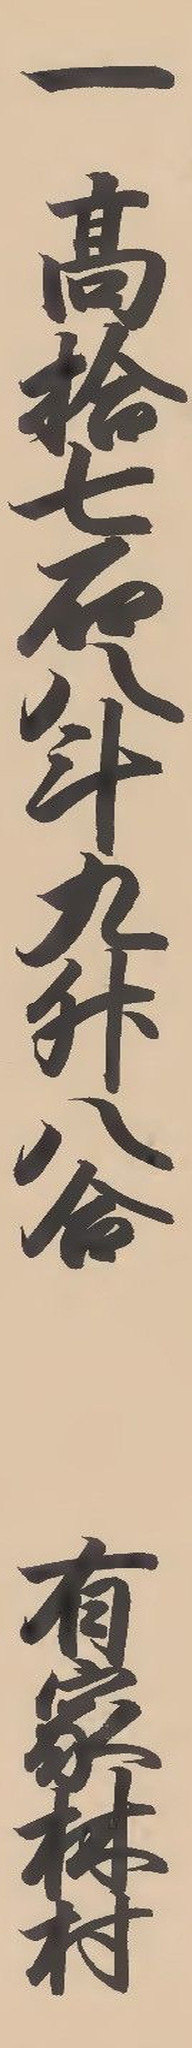一高拾七石八斗九升八合有家林村
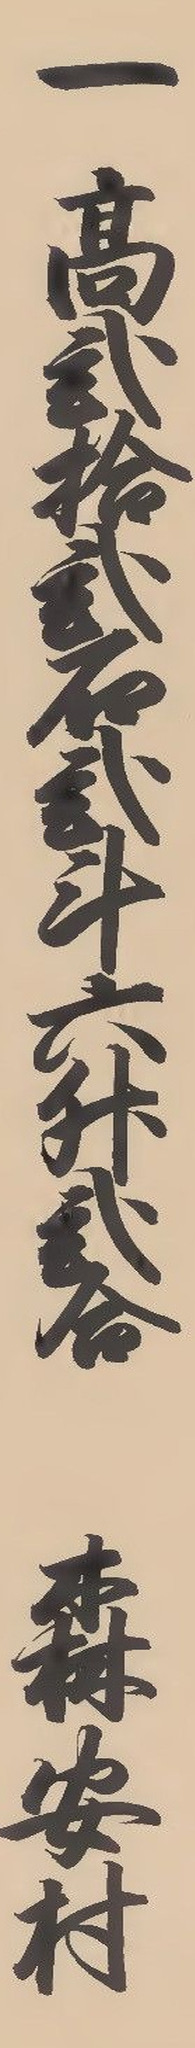一高弐拾弐石弐斗六升弐合森安村
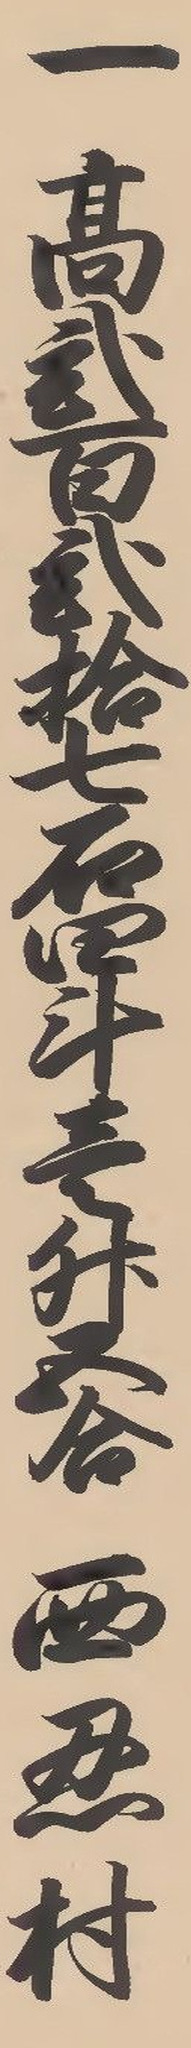一高弐百弐拾七石四斗壱升五合西忍村
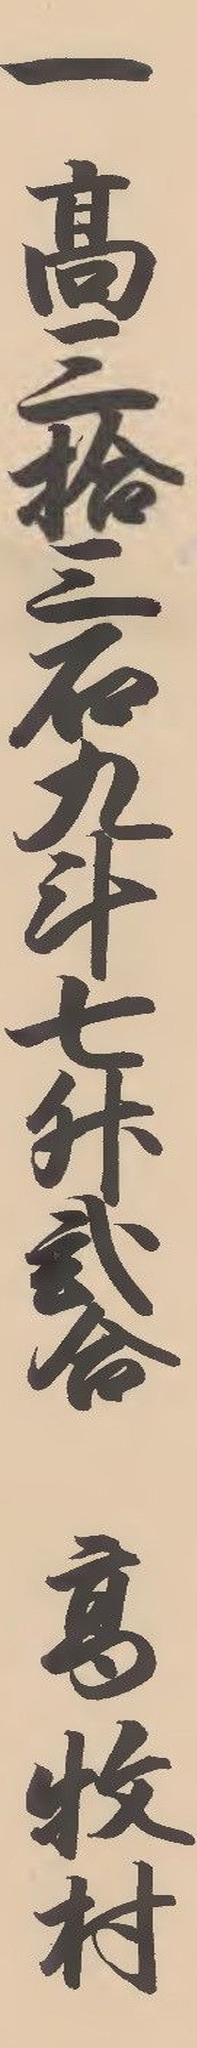一高三拾三石九斗七升弐合高牧村
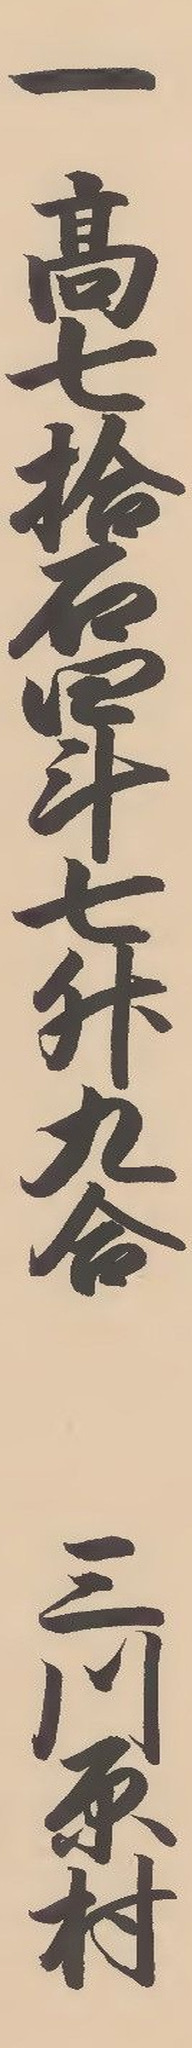一高七拾石四斗七升九合三川原村
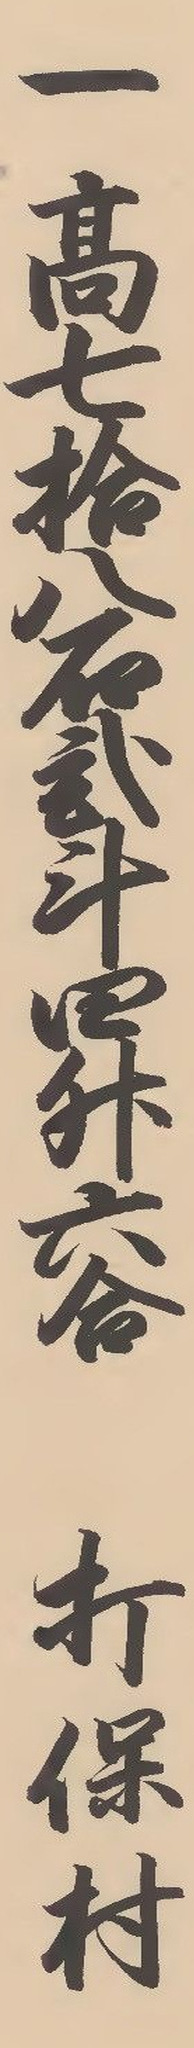一高七拾八石弐斗四升六合打保村
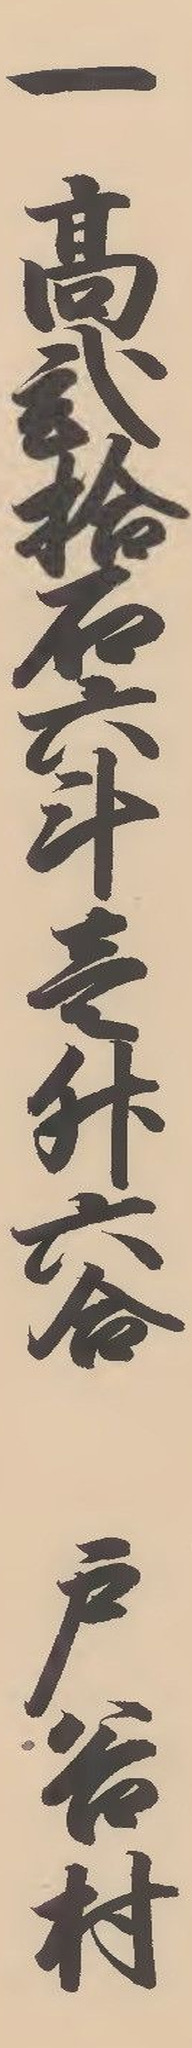一高弐拾石六斗壱升六合戸谷村

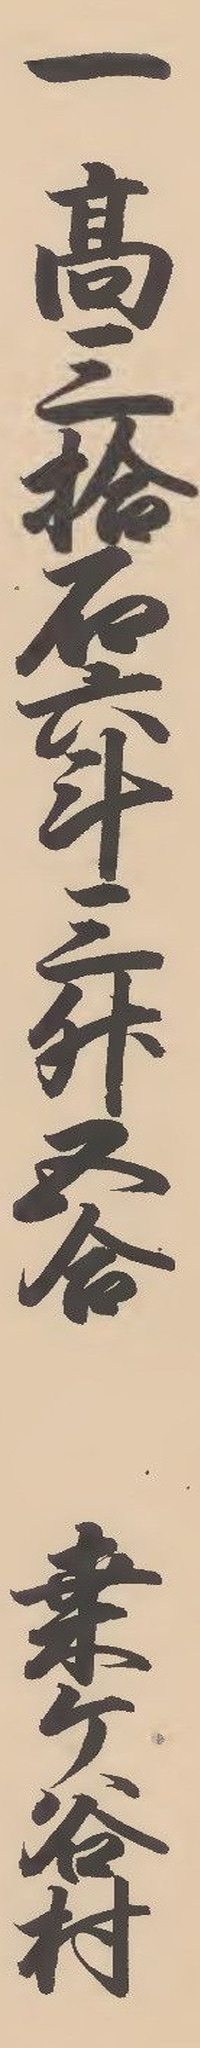一高三拾石六斗三升五合桑ヶ谷村
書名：飛騨国郷帳
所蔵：国立公文書館 National Archives of Japan
